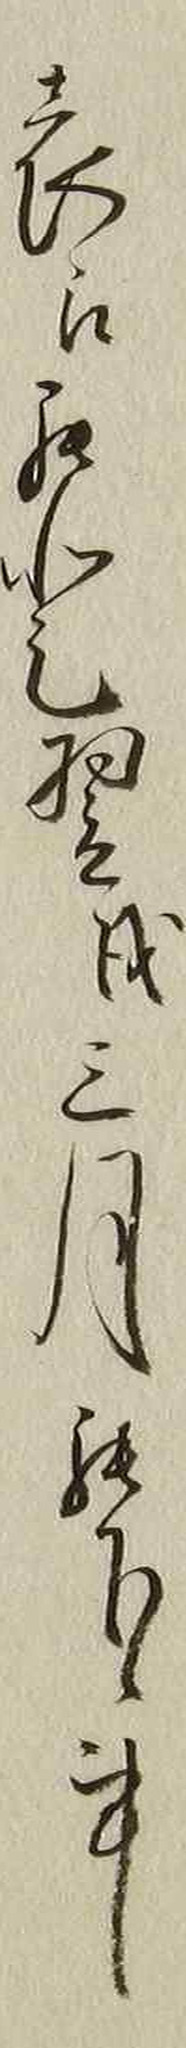表江罷登翌戌三月罷下候事
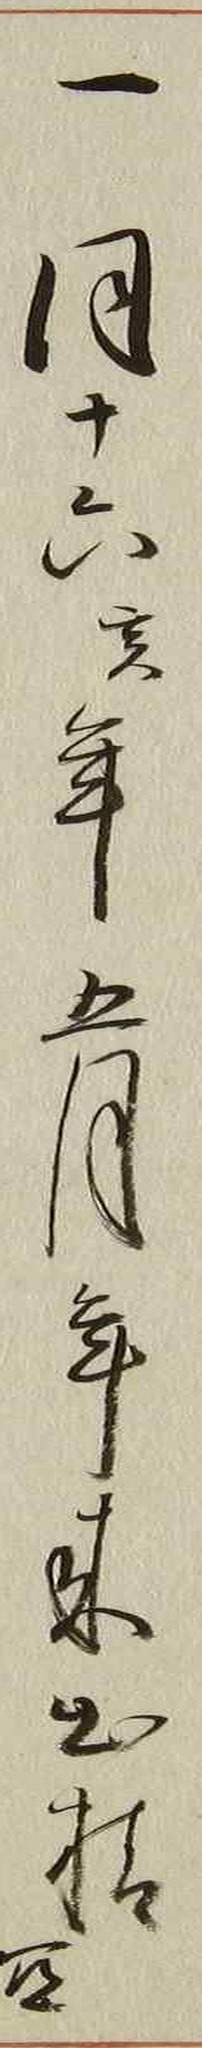一同十六亥年五月年来出精宜
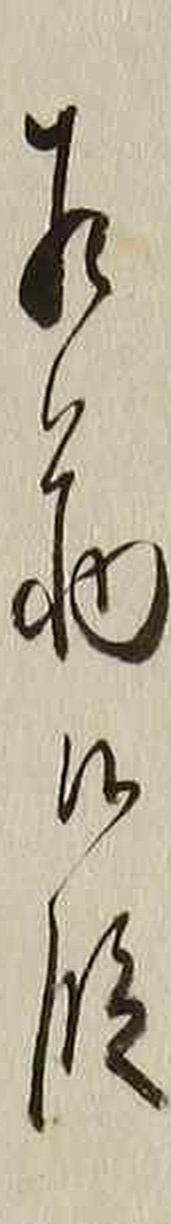相勤候段
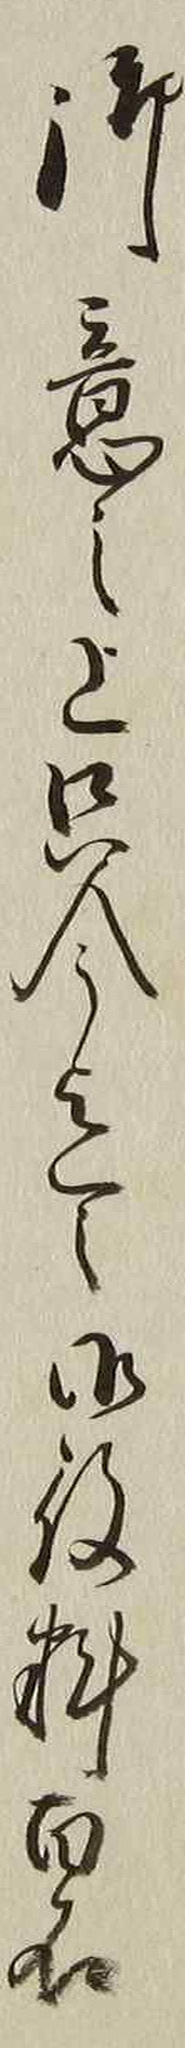御意之上只今迄之御役料百石
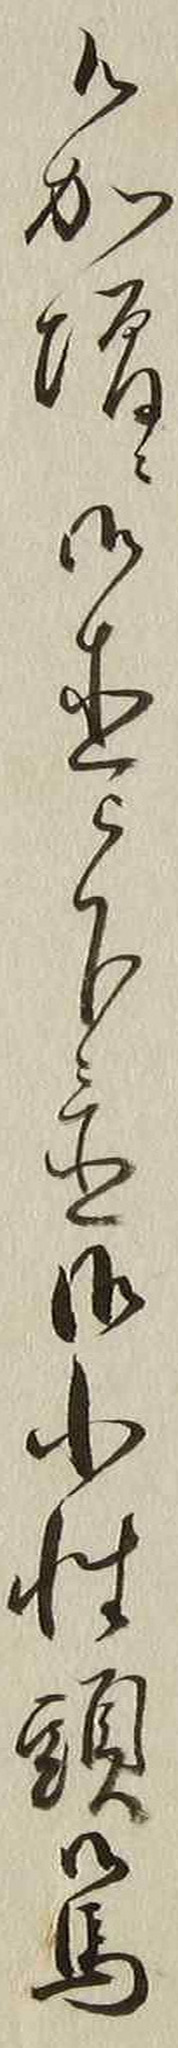御加増ニ御直被下置御小性頭御馬
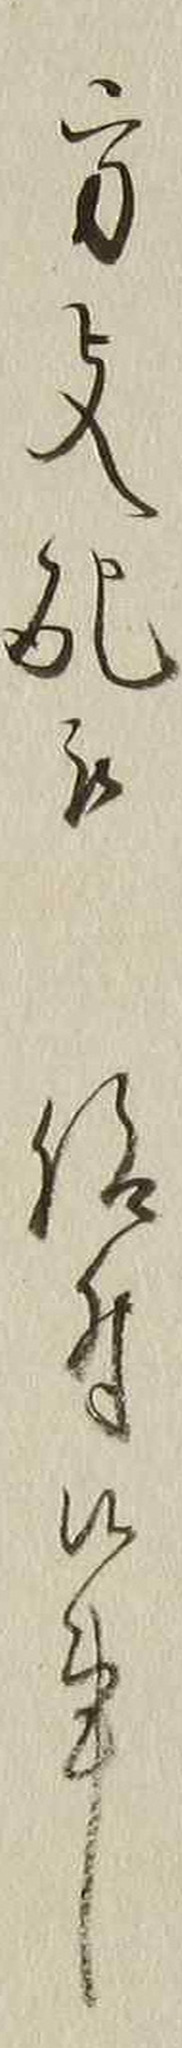方支配被仰付候事
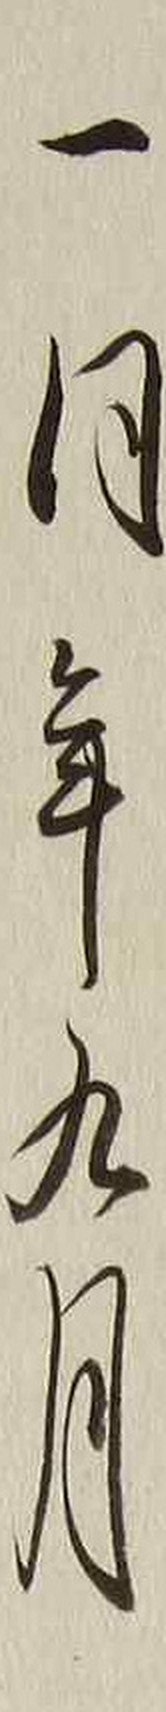一同年九月
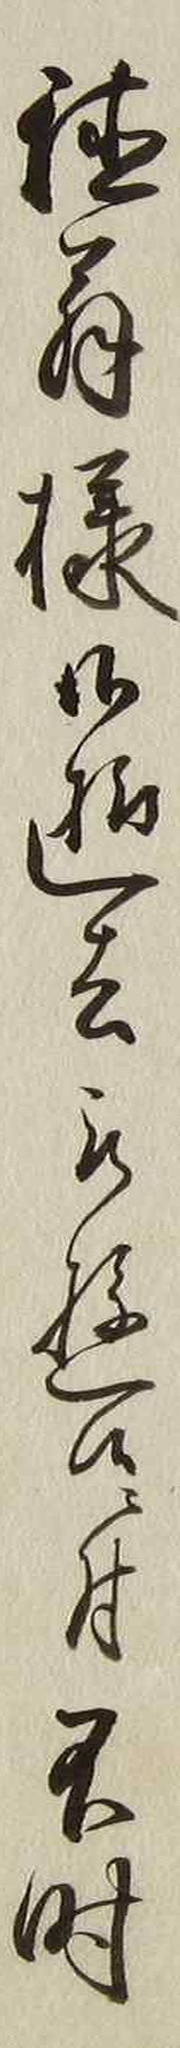徳翁様御逝去被遊候ニ付不時
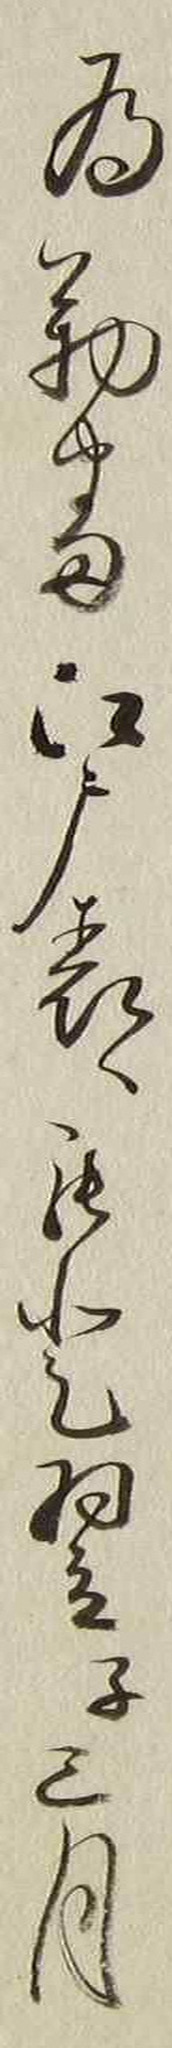為勤番江戸表へ罷登翌子三月
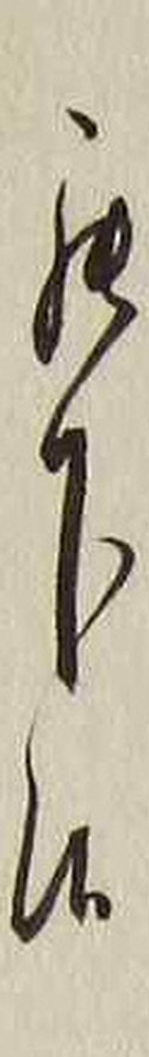罷下候
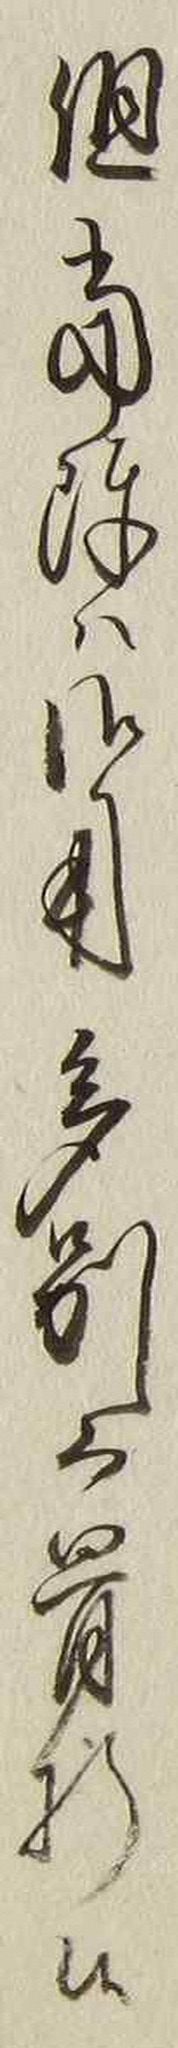但当陣ハ御用多別而骨折候
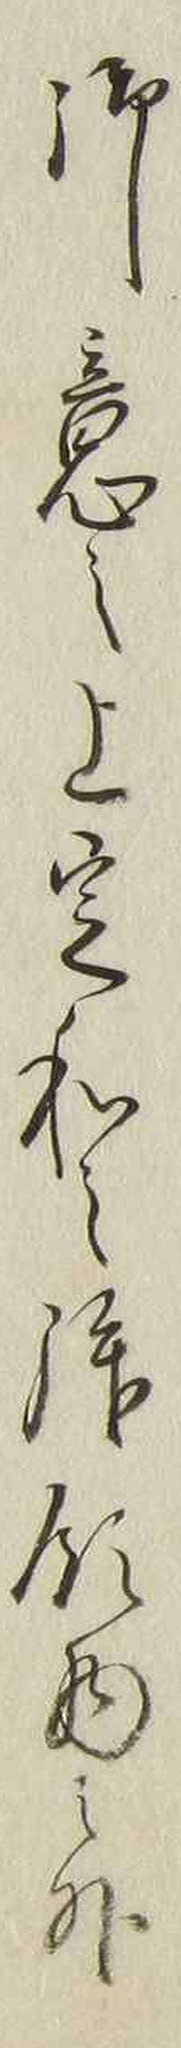御意之定和之拝領物之外

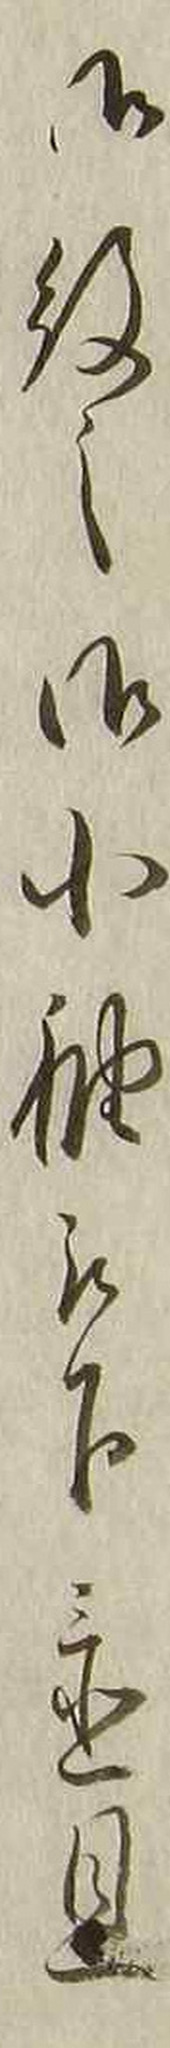御紋之御小袖被下置且
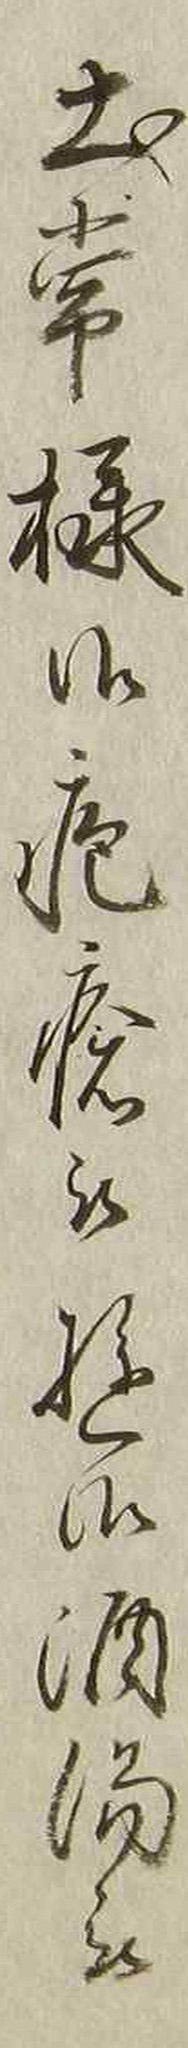土常様御疱瘡被遊御酒湯被
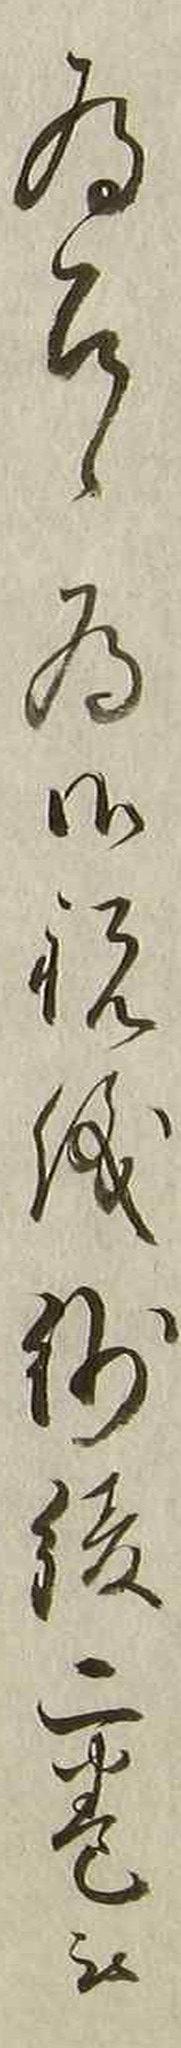為召候為御祝儀紗綾二巻被
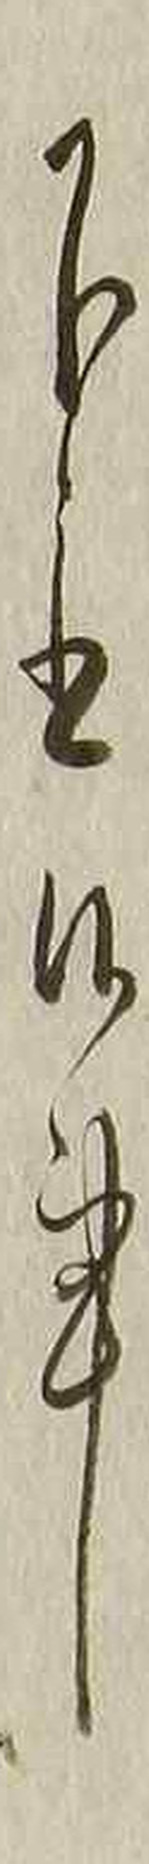下置候事
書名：諸士系譜　巻之18　い之部18
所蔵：会津若松市立会津図書館
